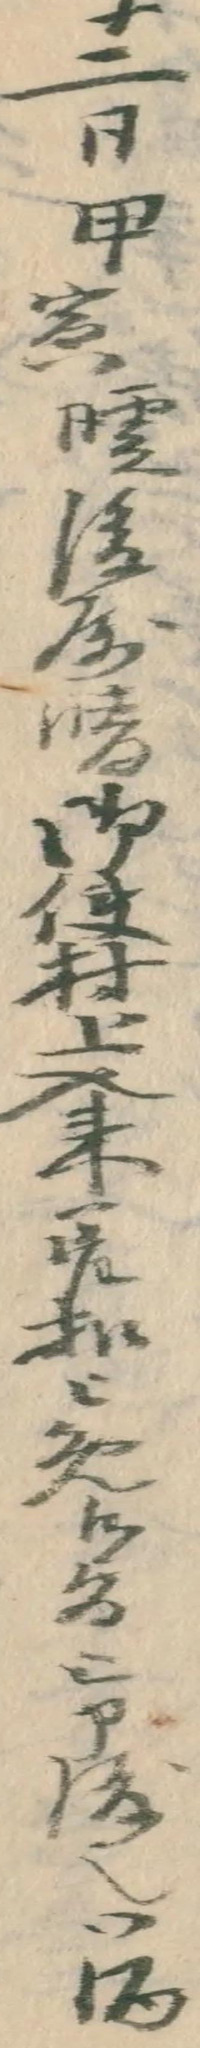十二日甲寅曇後属晴御使村上入来差扣被免候旨被申渡也御酒
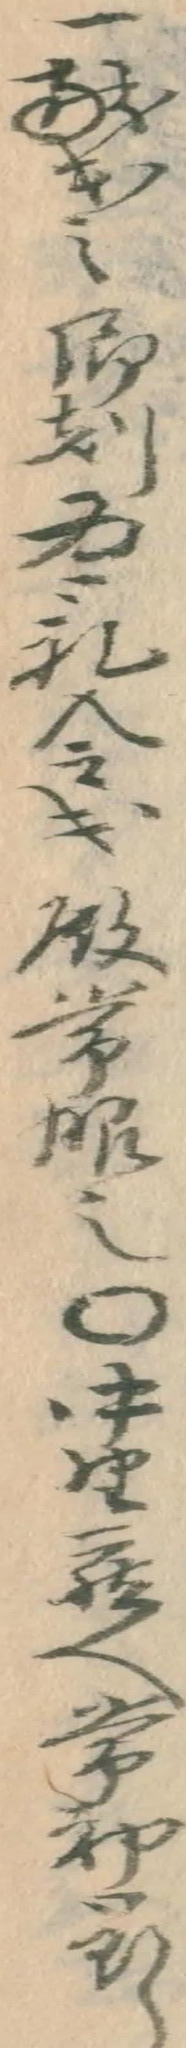一献出也即刻為御礼令出殿常服也〇中野蔵人常初御預り

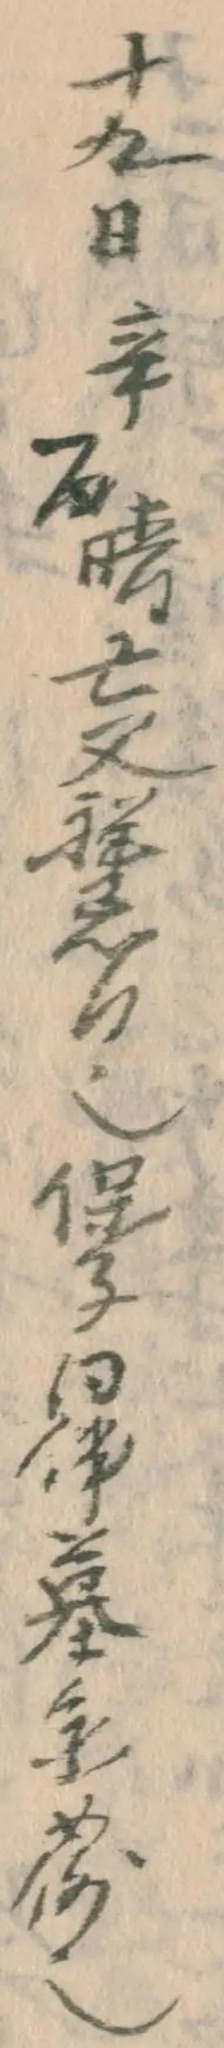十九日辛酉晴亡父祥忌日也保子同伴墓参如例也
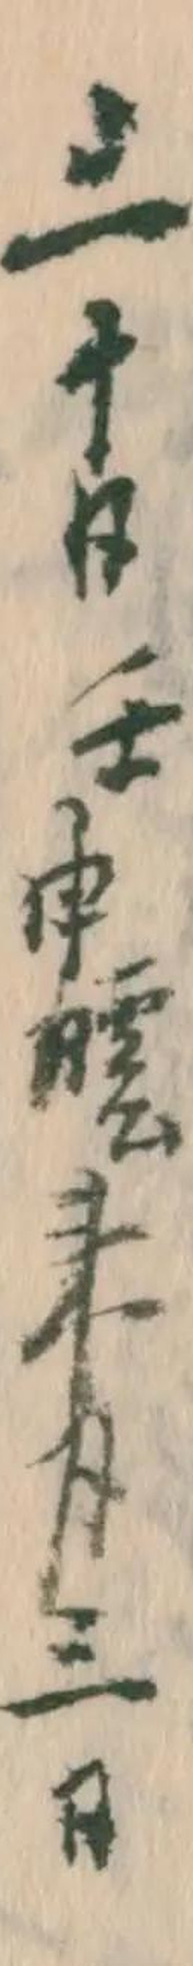三十日壬申晴来月三日
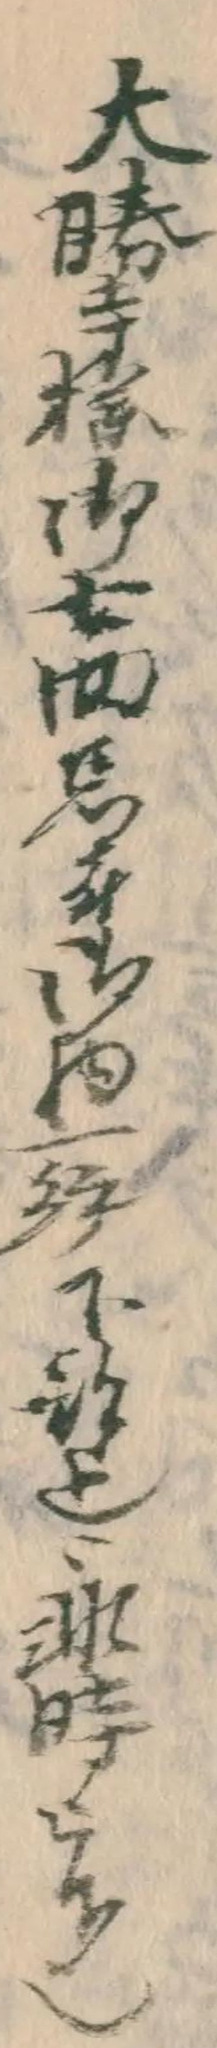大勝寺様御七回忌ニ付御内一統下部迄御非時被下也
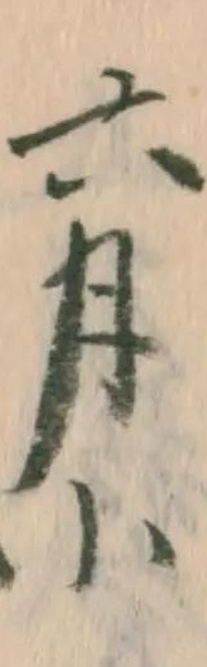六月小
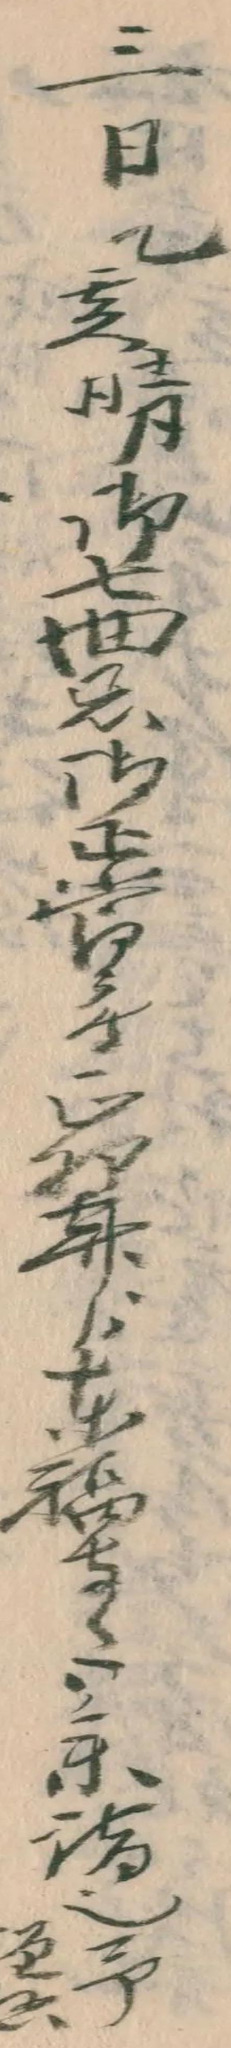三日乙亥晴御七回忌御正當ニ付正卯刻ゟ東福寺へ御参詣也予経啓
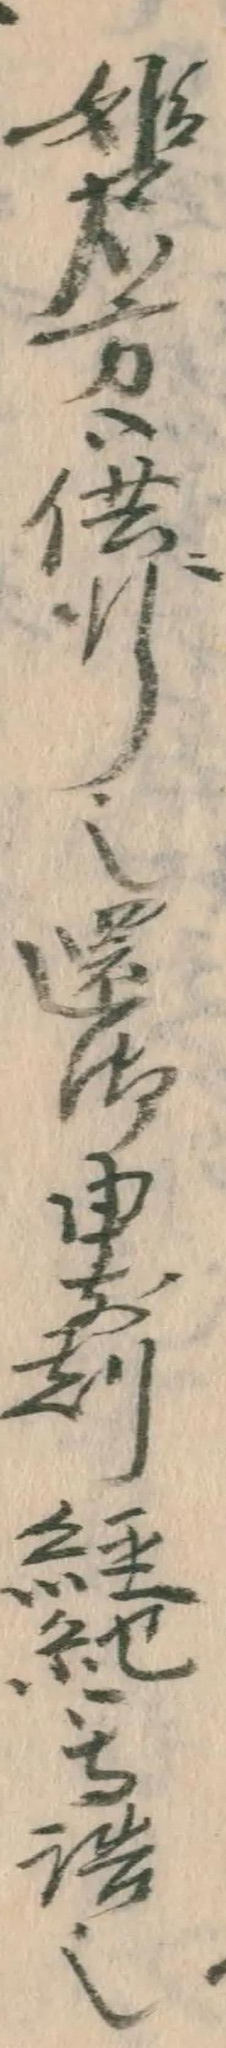姫君方御供行也還御申前刻経紀尊詰也
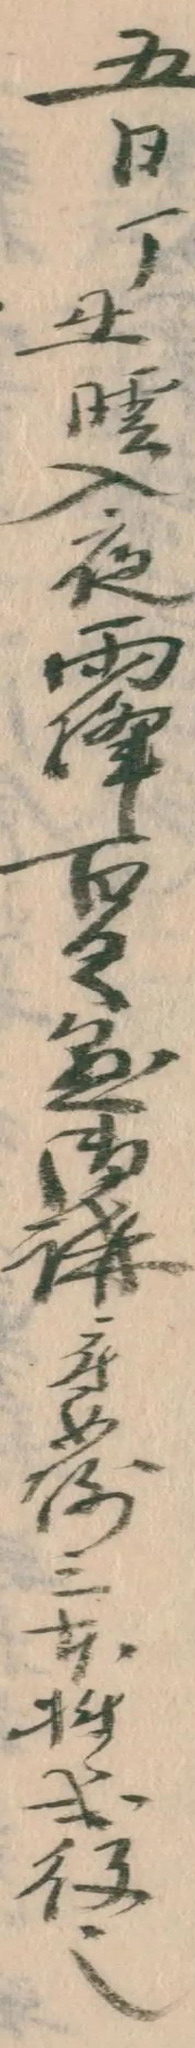五日丁丑曇入夜雨降百匁懸御講ニ付如例三本樹出役也
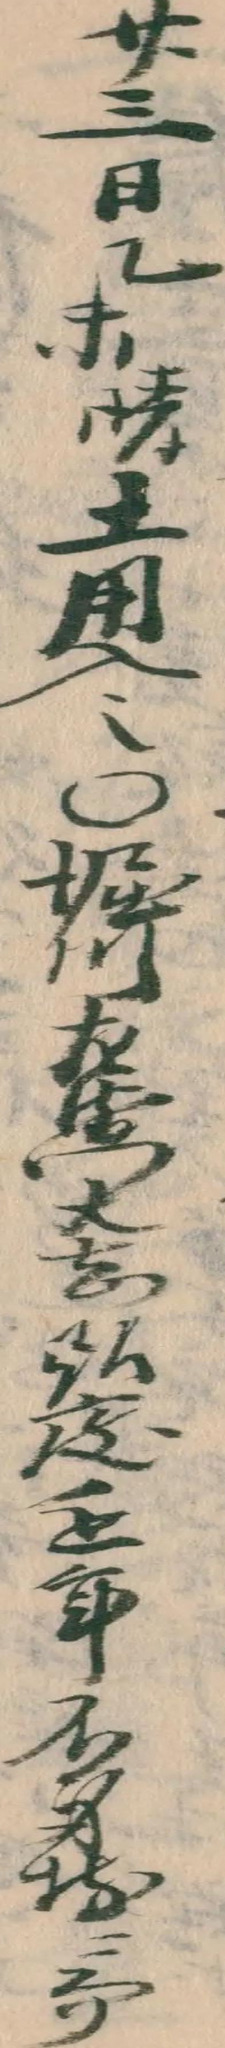廿三日乙未晴土用入也○堀川左衛門大志弘度近年不身持ニ而
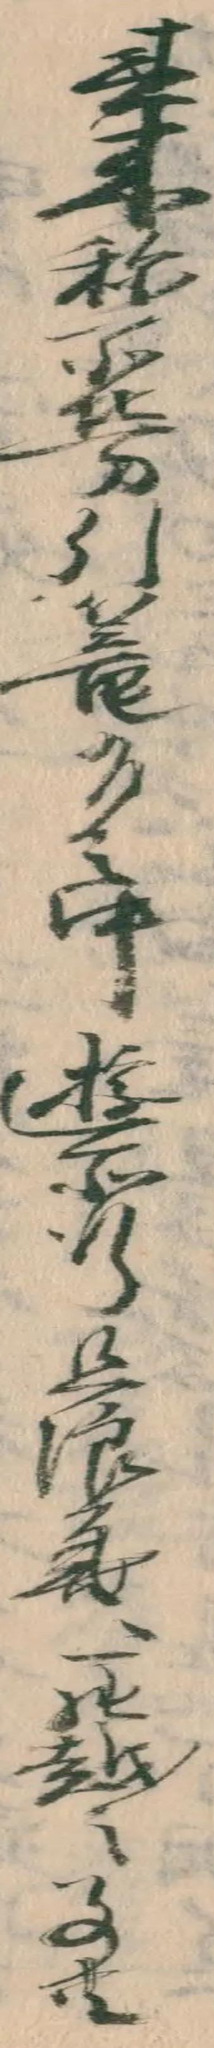春来称所労引篭有之中遊所行且浪氣へ罷越之事共
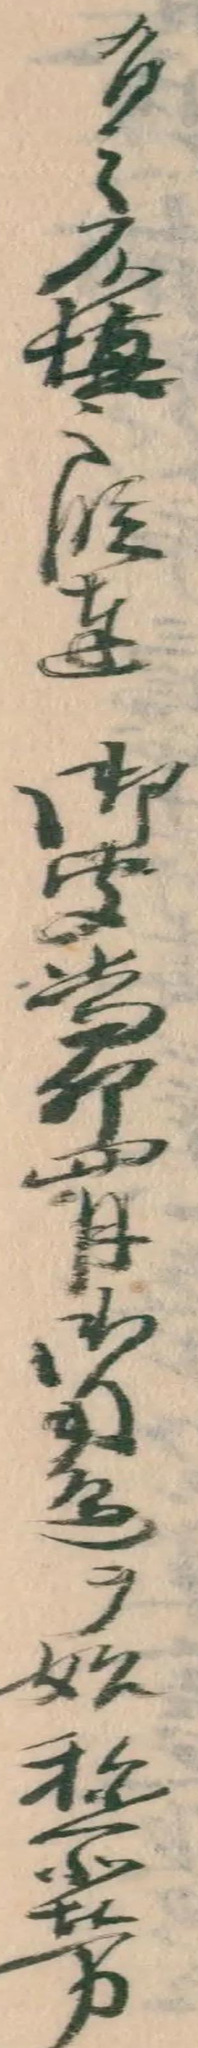有之不慎之段達御聞當卯四月御用邊ヲ始称所労
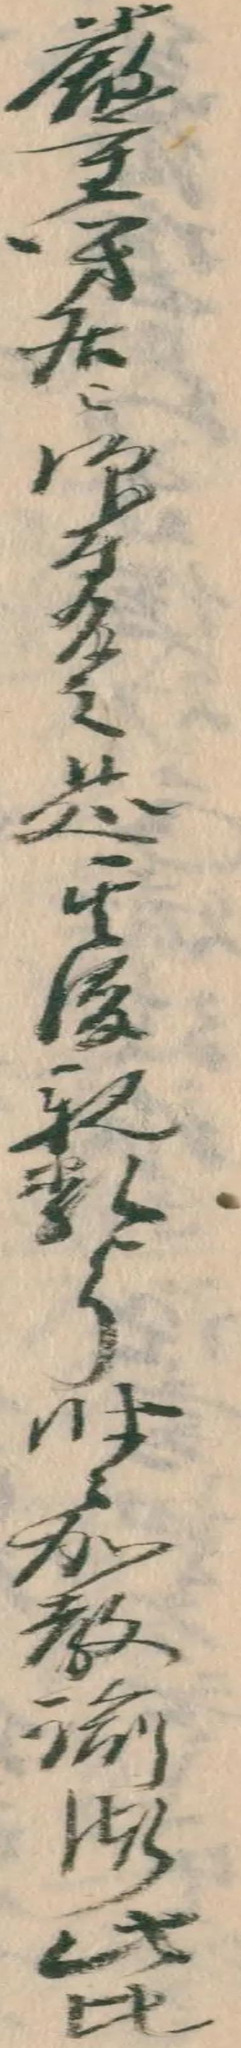厳重閉居被仰付有之処其後親類より時々加教諭漸此比
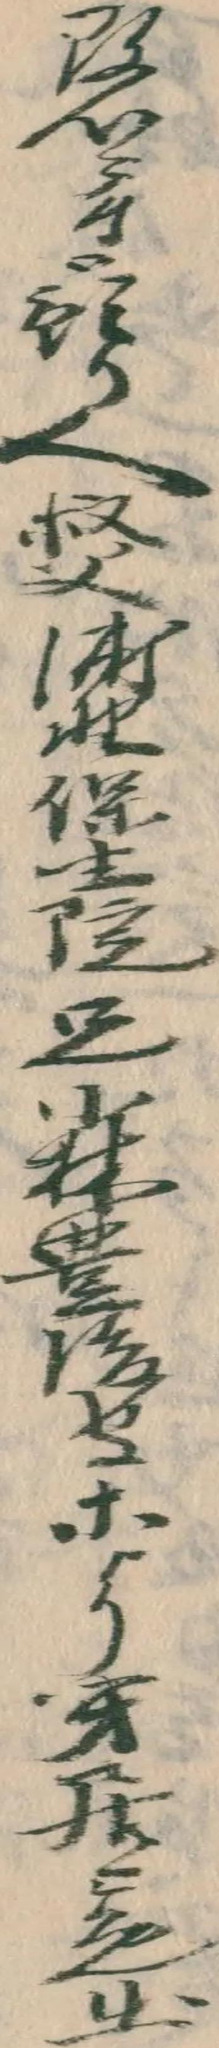改心ニ付御預り人叔父浦野保生院兄小林豊後守等より閉居被免出
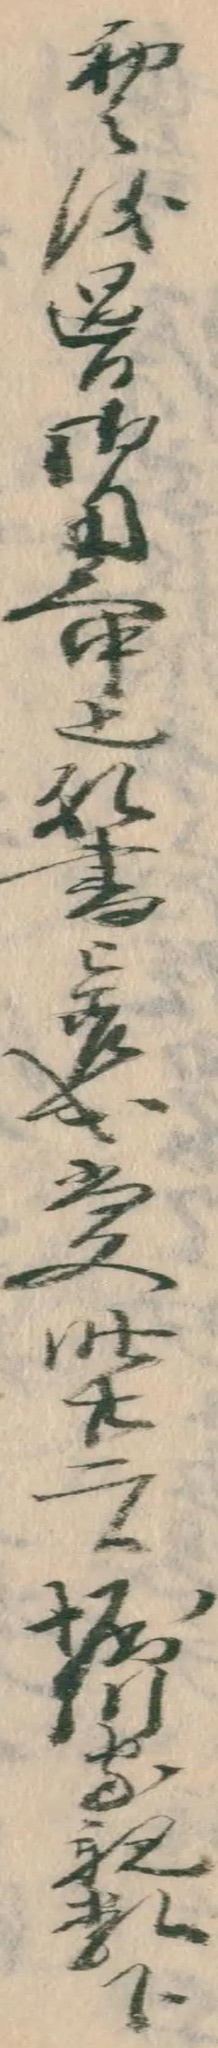勤之儀過日御用人中迄願書被差出尚又昨廿二日堀川家親類下
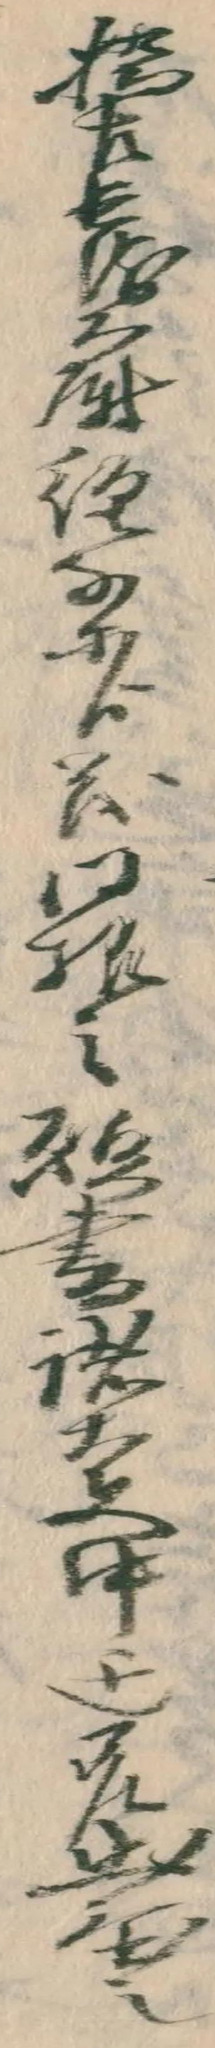橋左兵衛大尉経千等ゟも同様之願書諸大夫中迄差出置之
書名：賀茂社記録. 第69冊
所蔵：国立国会図書館 National Diet Library, JAPAN
